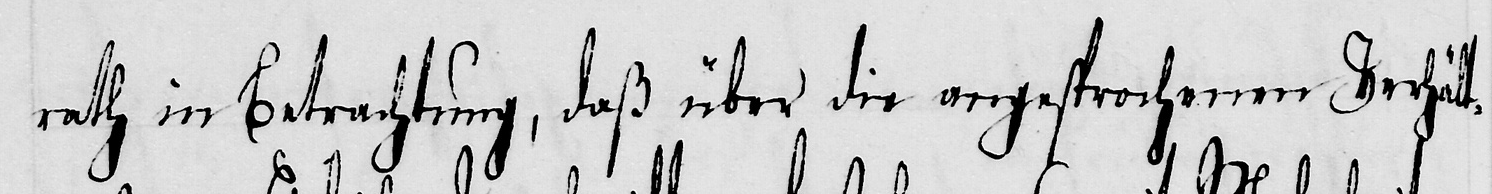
rath in Betrachtung, daß über die angesprochenen Verhäl¬
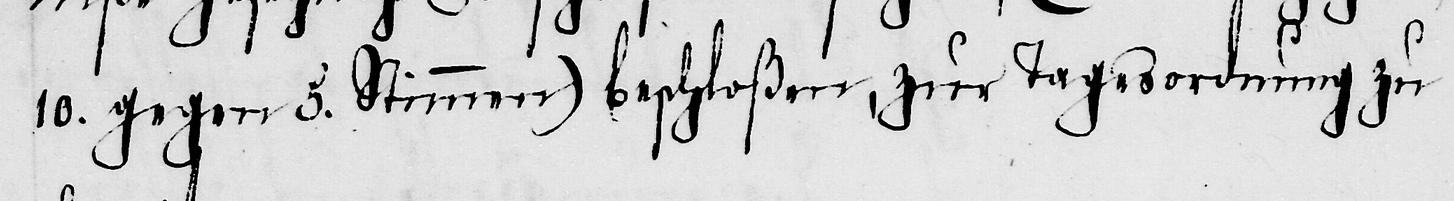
10. gegen 5. Stimmen) beschloßen, zur Tagesordnung zu
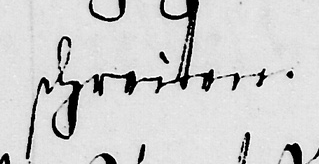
schreiten.
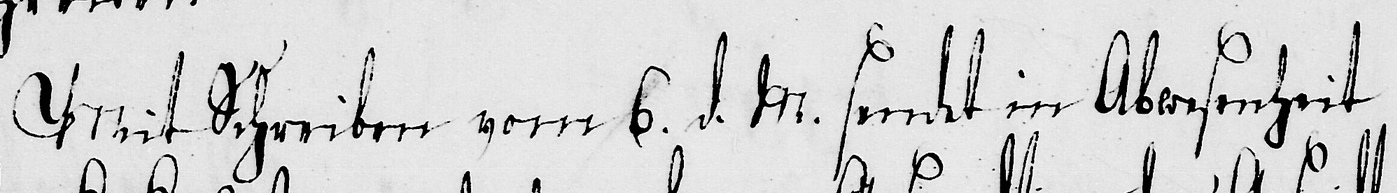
Mit Schreiben vom 6. d. M. sendet in Abwesenheit
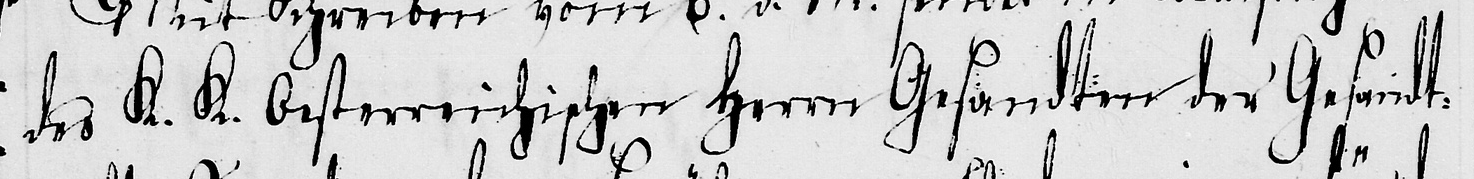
des K. K. Oesterreichischen Herrn Gesandten der Gesandt¬
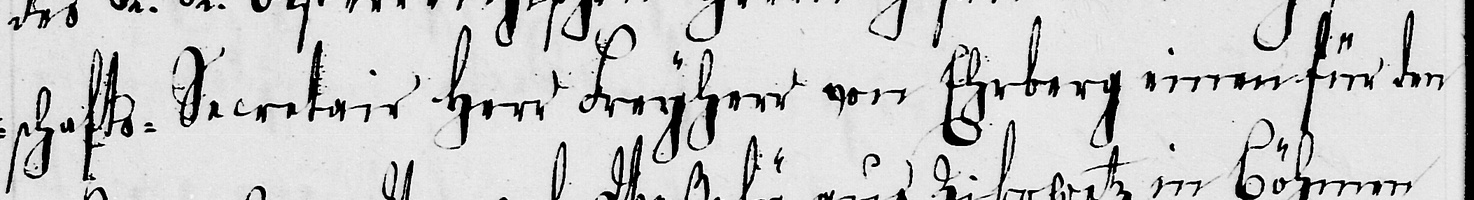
schafts-Secretair Herr Freyherr von Ehrberg einen für den
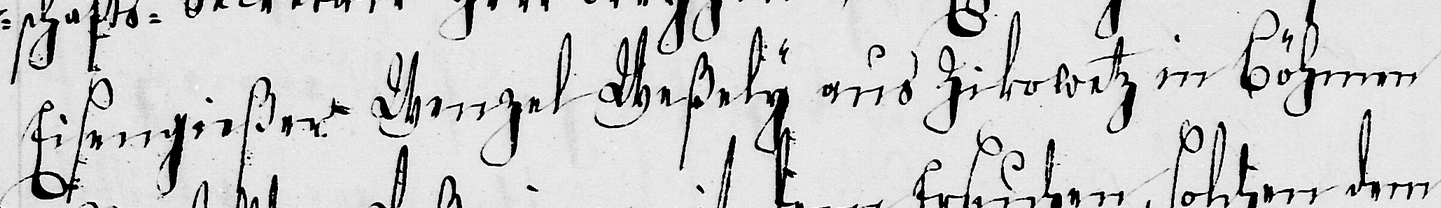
Eisengießer Wenzel Weßely aus Zikowetz in Böhmen
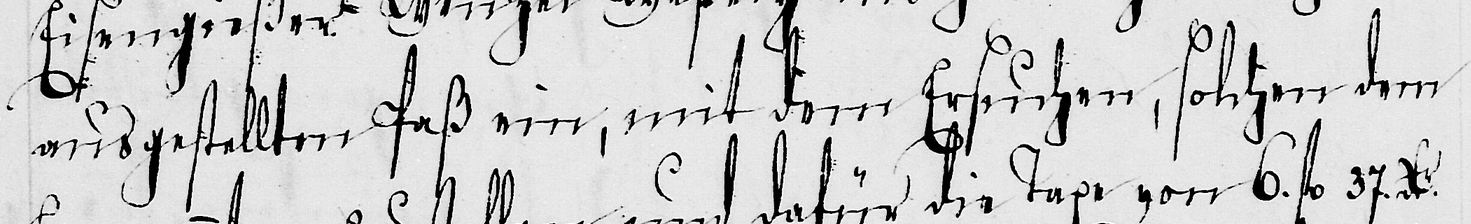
ausgestellten Paß ein, mit dem Ersuchen, solchen dem
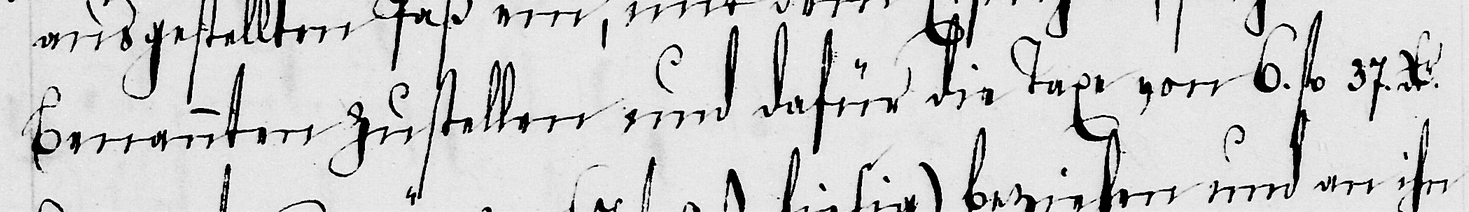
Benannten zustellen und dafür die Taxe von 6. fl. 37.
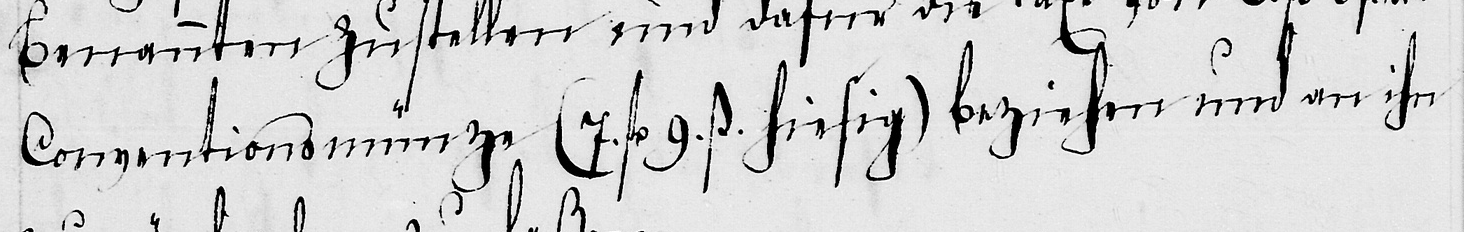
Conventionsmünze (7. fl. 9. ß hiesig) beziehen und an ihn
